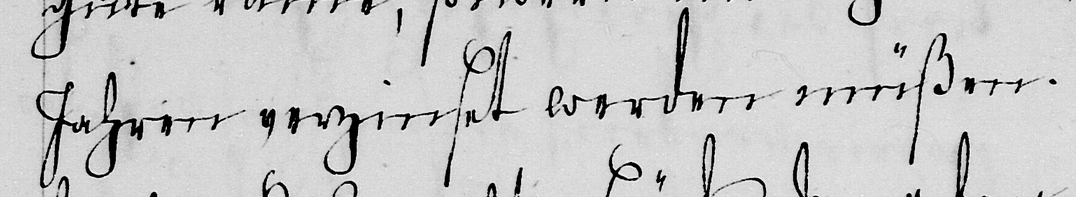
Jahren verzinst werden müßen.
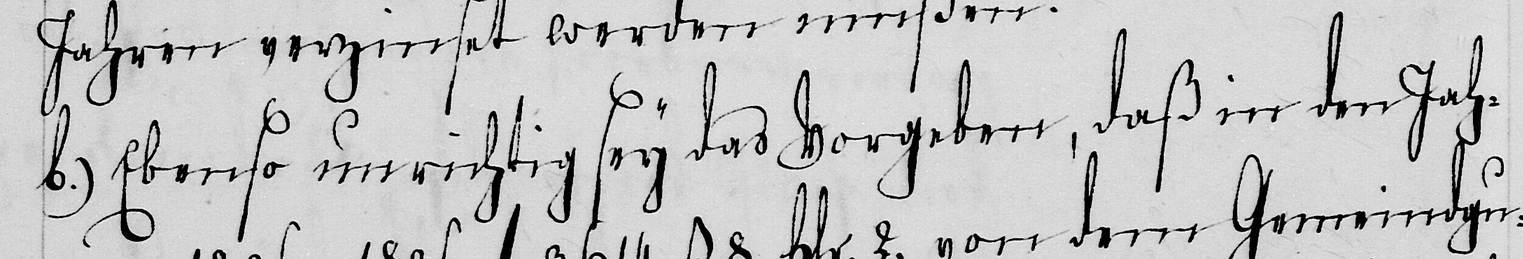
b.) Ebenso unrichtig sey das Vorgeben, daß in den Jah¬
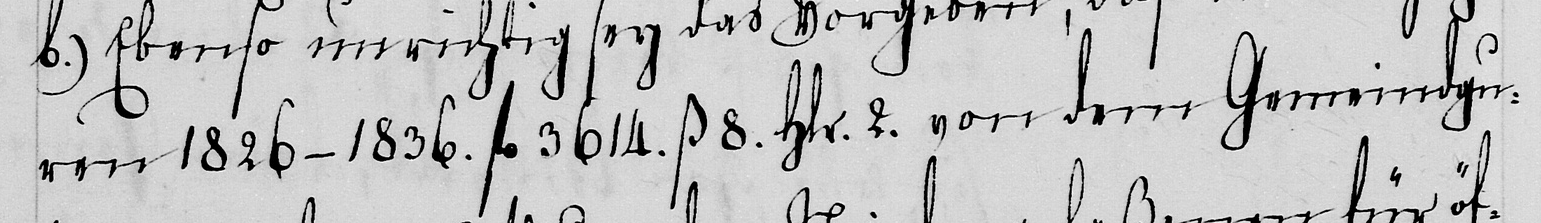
ren 1826–1836. fl. 3614. ß. 8. Hlr. 2. von dem Gemeindgu¬
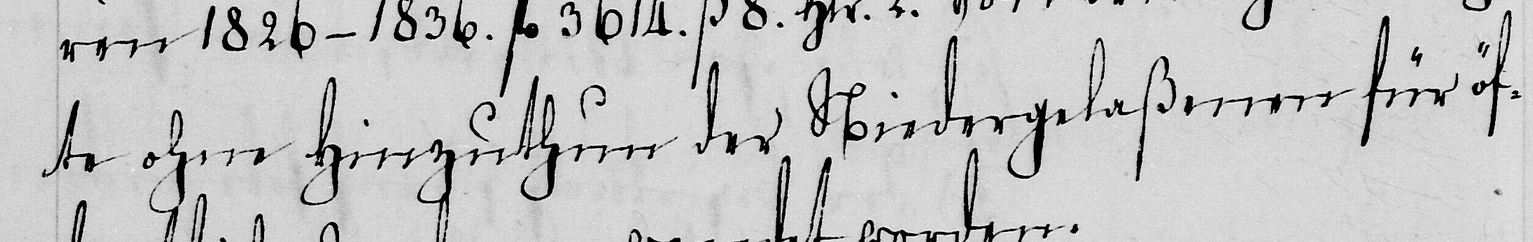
te ohne Hinzuthun der Niedergelaßenen für ö¬
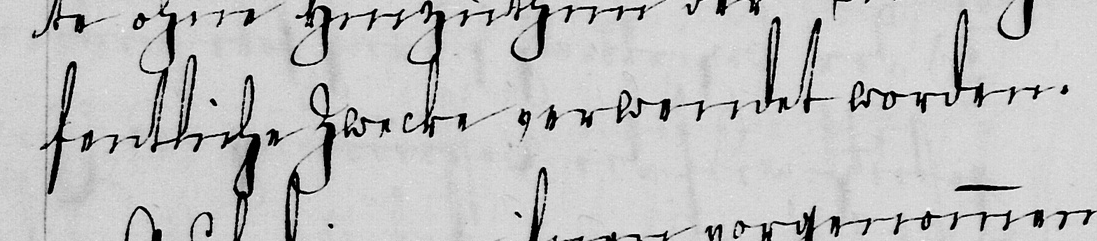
ffentliche Zwecke verwendet worden.
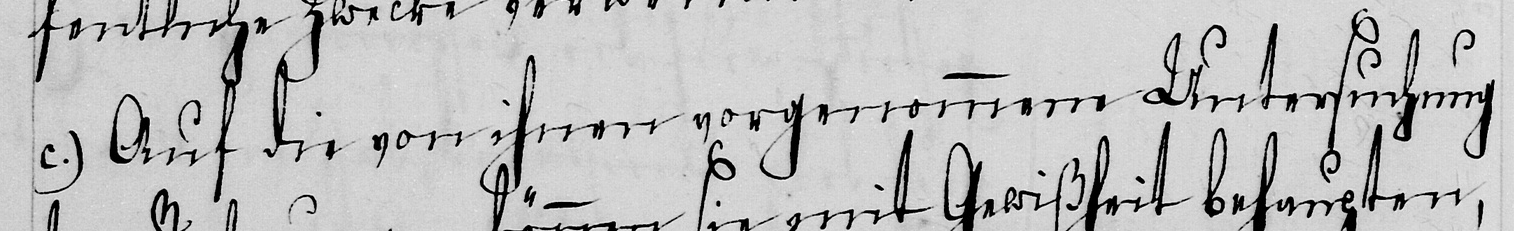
c.) Auf die von ihnen vorgenommene Untersuchung
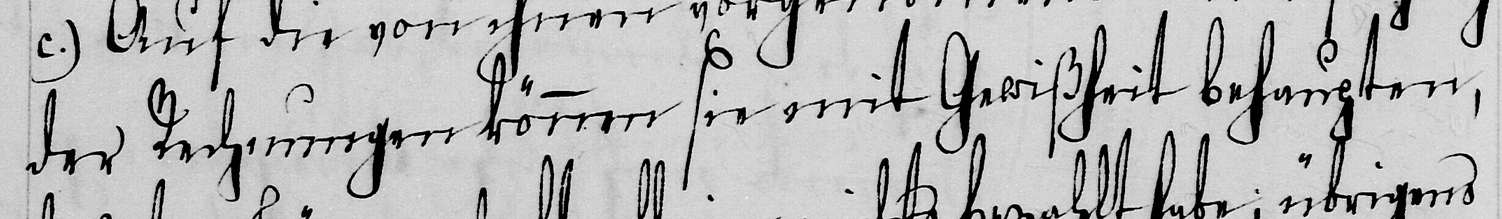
der Rechnungen können sie mit Gewißheit behaupten,
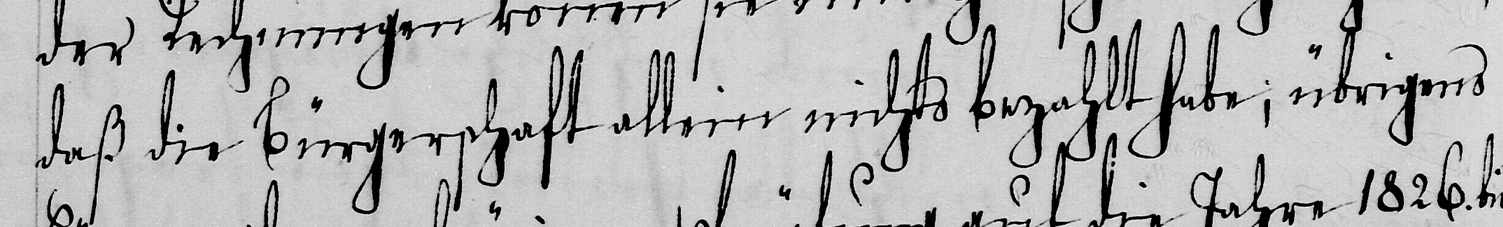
daß die Bürgerschaft allein nichts bezahlt habe; übrige¬
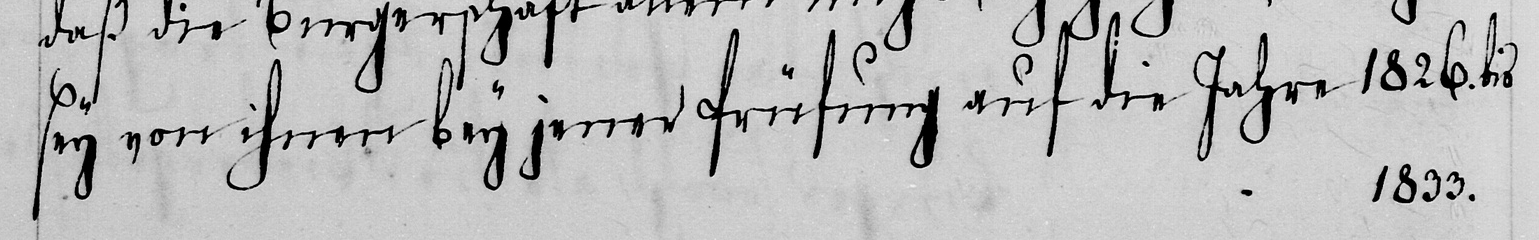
sey von ihnen bey jener Prüfung auf die Jahre 1826.
